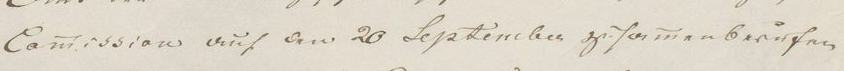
Commission auf den 20 September zusammenberufen
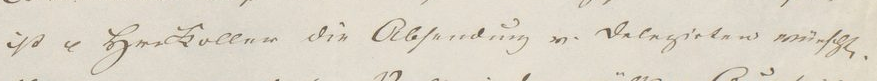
ist & Her Koller die Absendung v. Delegirten wünscht.
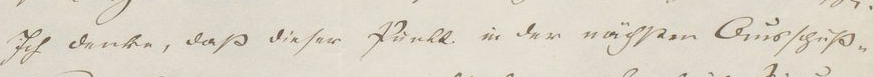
Ich denke, daß dieser Punkt in der nächsten Ausschuß-
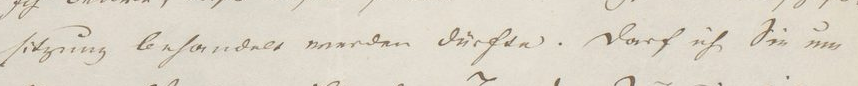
sitzung behandelt werden dürfte. Darf ich Sie um
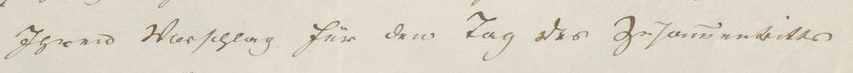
Ihren Vorschlag für den Tag des Zusammentritts
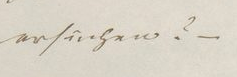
ersuchen? –
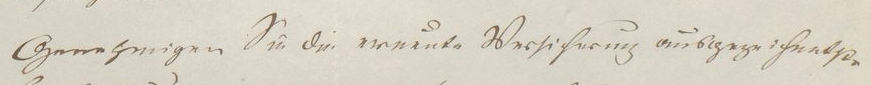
Genehmigen Sie die erneute Versicherung ausgezeichnetster
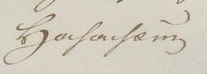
Hochachtung
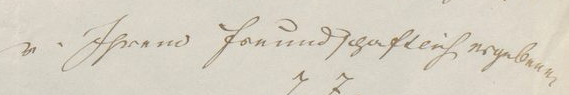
v. Ihrem freundschaftlich ergebenen
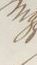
1865.
